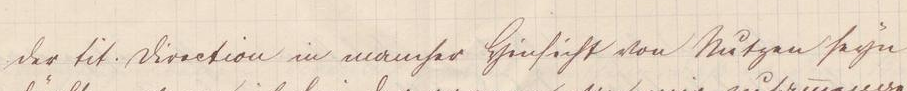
der tit. Direction in mancher Hinsicht von Nutzen seyn
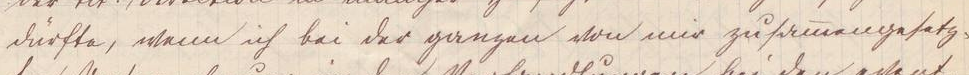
dürfte, wenn ich bei der ganzen von mir zusammengesetz-
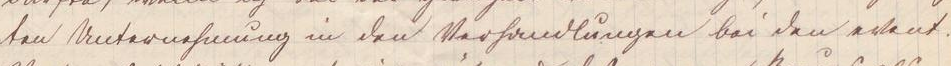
ten Unternehmung in den Verhandlungen bei den event.
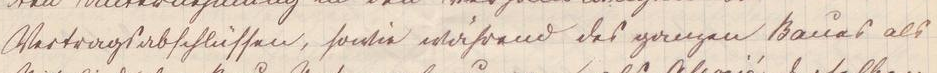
Vertragsabschlüssen, sowie während des ganzen Baues als
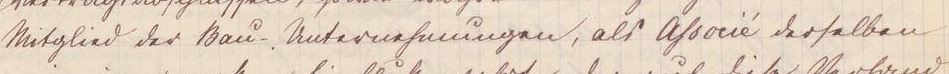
Mitglied der Bau- Unternehmungen, als Associé derselben
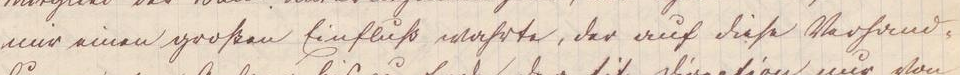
mir einen großen Einfluß wahrte, der auf diese Verhand-
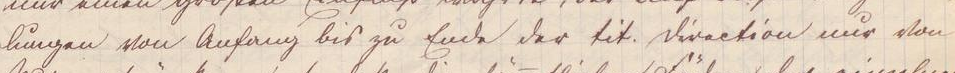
lungen von Anfang bis zu Ende der tit. Direction nur von
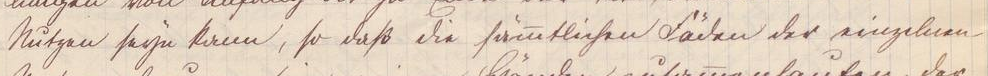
Nutzen seyn kann, so daß die sämmtlichen Fäden der einzelnen
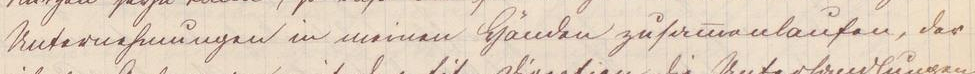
Unternehmungen in meinen Händen zusammenlaufen, der
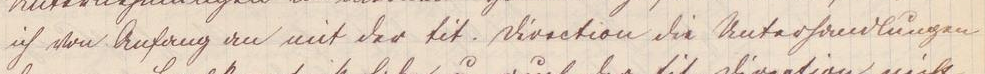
ich von Anfang an mit der tit. Direction die Unterhandlungen
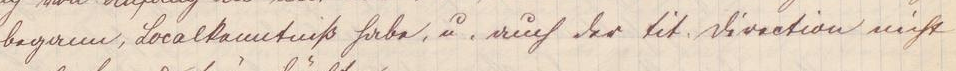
begann, Localkenntniß habe, u. auch der tit. Direction nicht
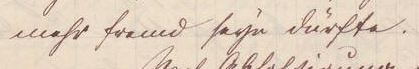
mehr fremd seyn dürfte.
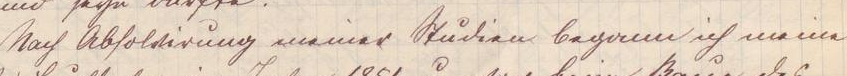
Nach Absolvirung meiner Studien begann ich meine
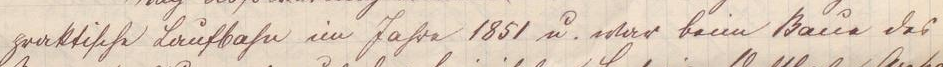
praktische Laufbahn im Jahre 1851 u. war beim Baue des
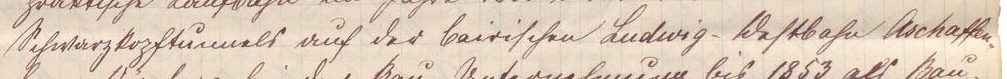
Schwarzkopftunnels auf der bairischen Ludwig-Westbahn Aschaffen-
